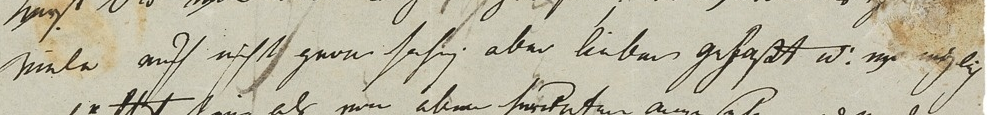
Viele auch nicht gern sehen; aber lieber gehaßt od: wo möglich
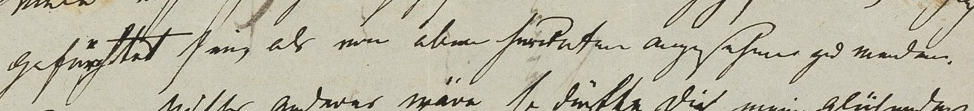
gefürchtet sein, als wie von oben herunter angesehen zu werden.
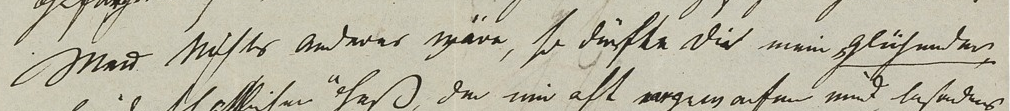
Wenn Nichts Anderes wäre, so dürfte dir mein «glühender,
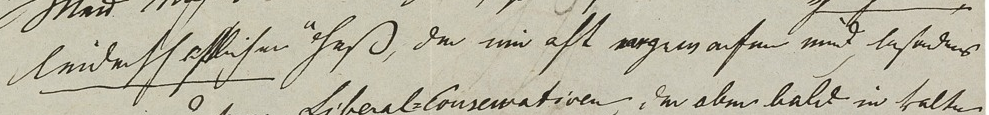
leidenschaftlicher» Haß, der mir oft vorgeworfen wird, besonders
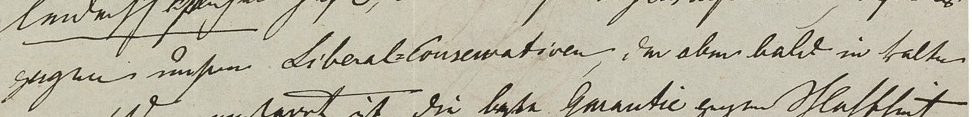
gegen unsere Liberal-Conservativen, der aber bald in kalter
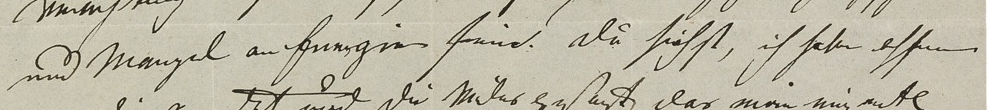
und Mangel an Energie sein. Du siehst, ich habe offen
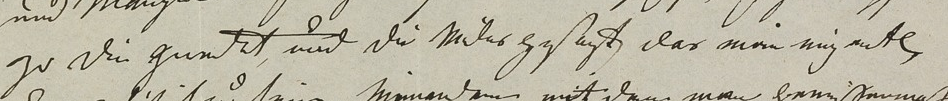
zu dir geredet, und dir Vieles gesagt, das man eigentl.,
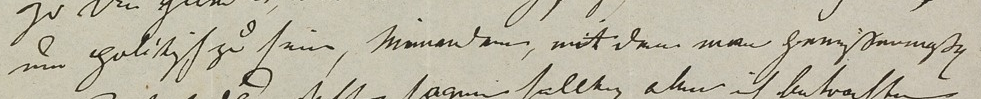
um politisch zu sein, Niemandem, mit dem man gewissermaßen
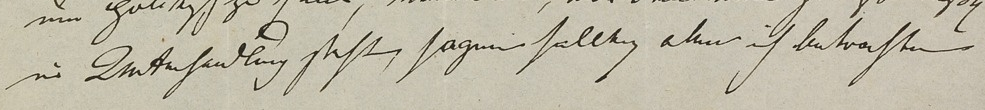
in Unterhandlung steht, sagen sollte, aber ich betrachte
